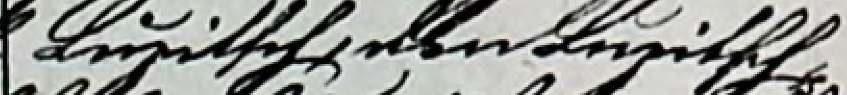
Lupitsch, den Lupitsch„
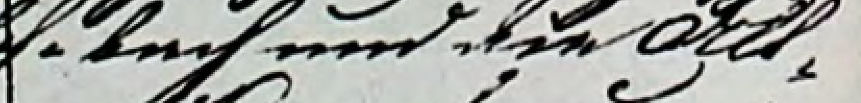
„bach und die Alt„
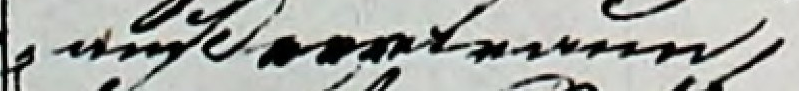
„außvertraun,
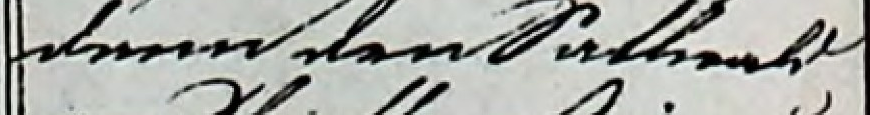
dann den Sattwald
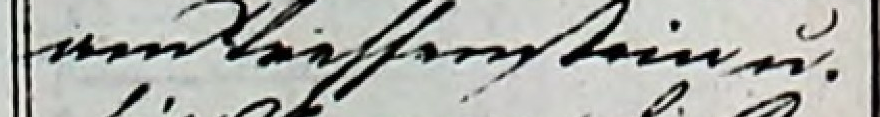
am Treffenstein u.
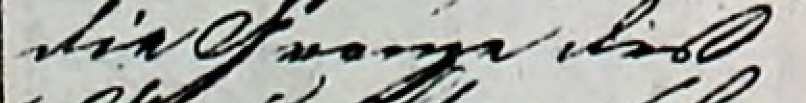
die Grenze des
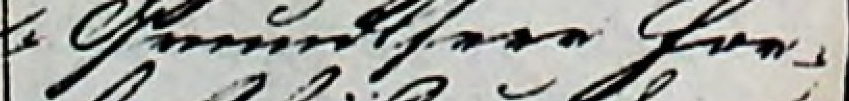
Grundsere Hor„
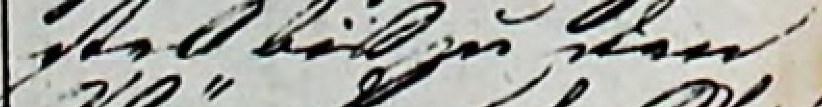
stes bis zu den
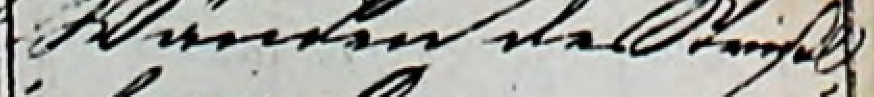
Wänden des Triefel„
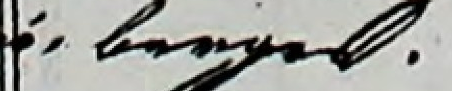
„berges.
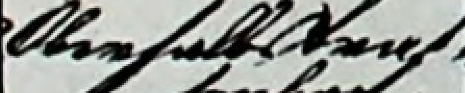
Oberhalbstraf„
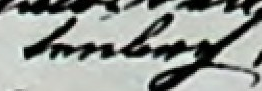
fenbach.
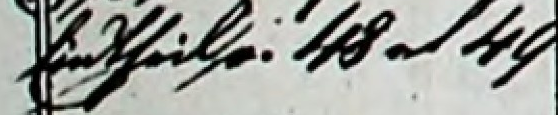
Ein Theil in 48 et 49
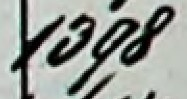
1398
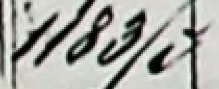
1183/c
